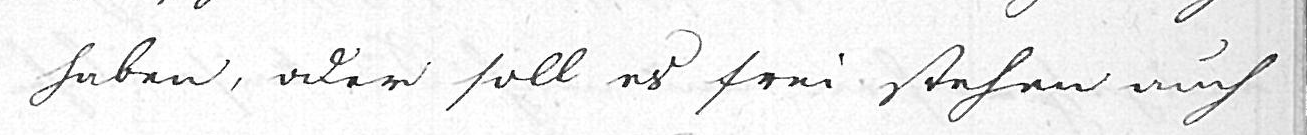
haben, oder soll es frei stehen auch
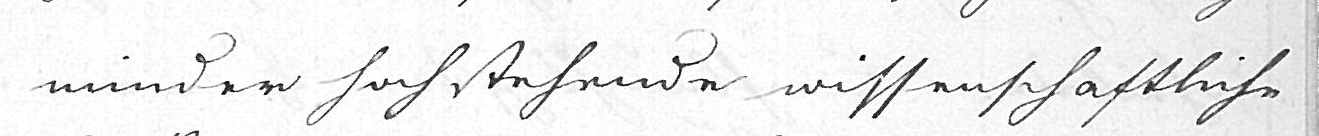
minder hochgestehende wissenschaftliche
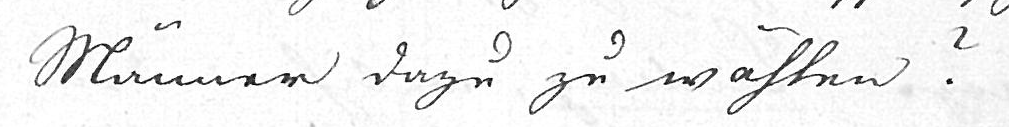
Männer dazu zu wählen?
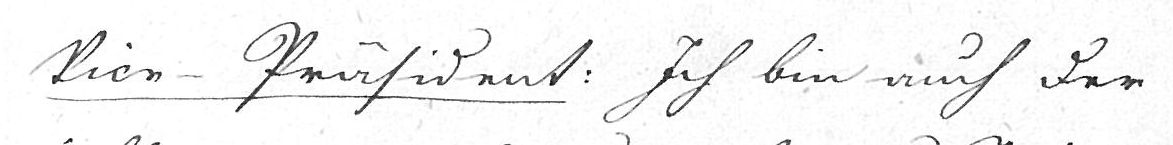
Vice-Präsident: Ich bin auch der
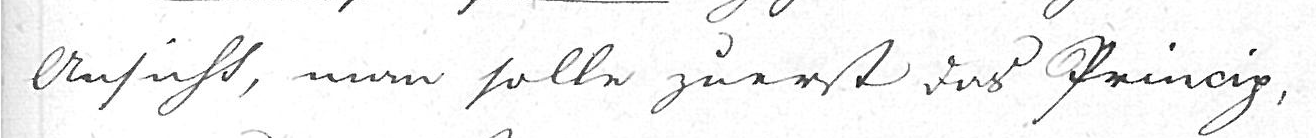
Ansicht, man sollte zuerst das Princip,
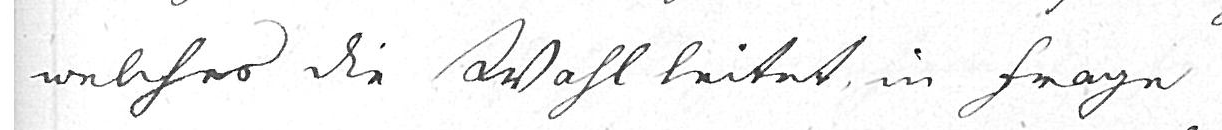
welches die Wahl leitet, in Frage
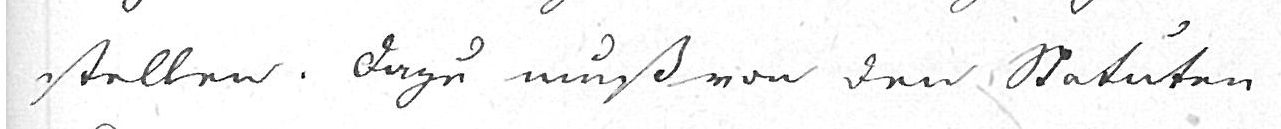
stellen. Dazu muß von den Statuten
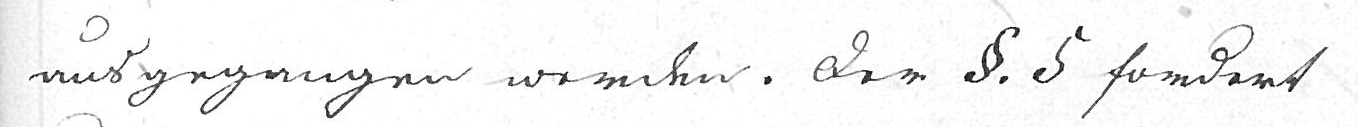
ausgegangen werden. Das §. 5. fordert
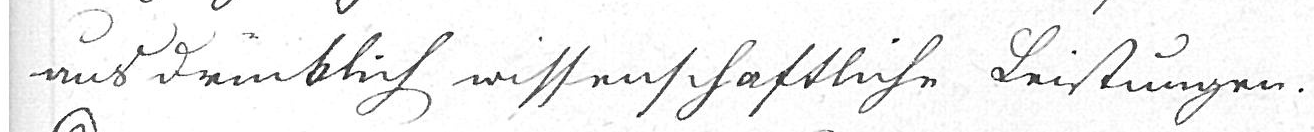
ausdrücklich wissenschaftliche Leistungen.
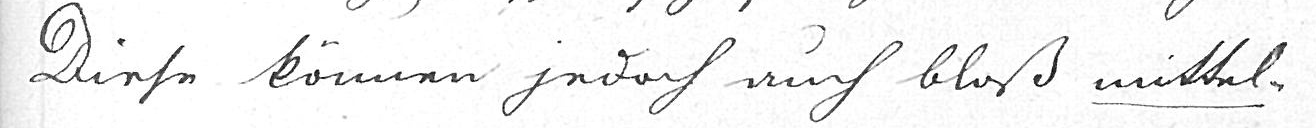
Diese können jedoch auch bloß mittel-
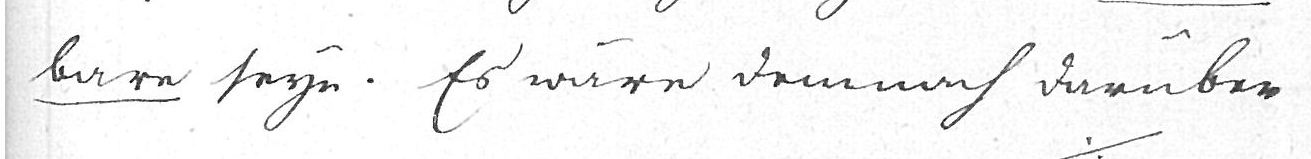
bare seyn. Es wäre demnach darüber
